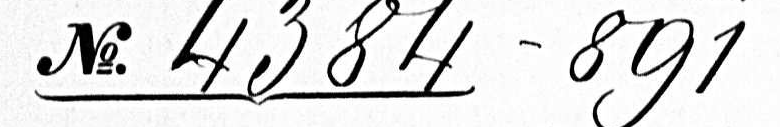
No 4384– 1891
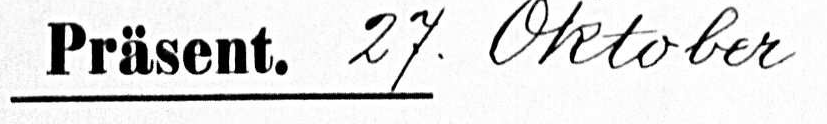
Präsent. – 27. Oktober
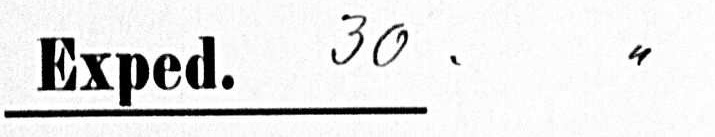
Exped. – 30. „
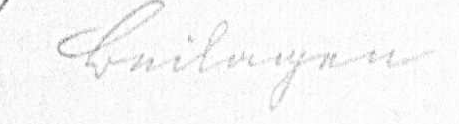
Beilagen
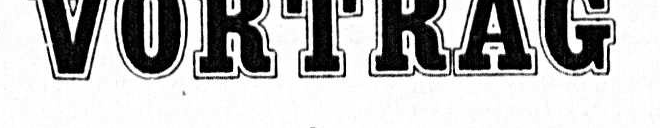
Vortrag
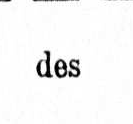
des
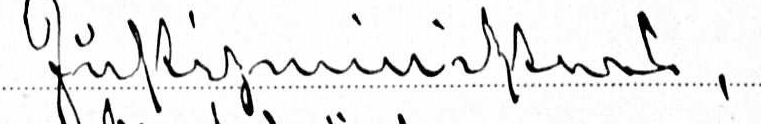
Justizministers,
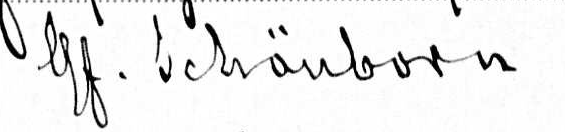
Gf. Schönborn
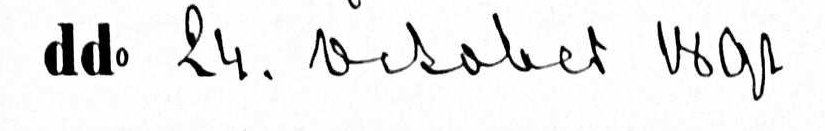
ddo 24. Oktober 1891
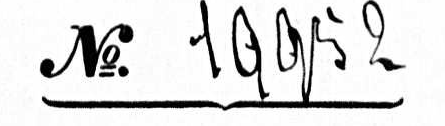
No. 19952
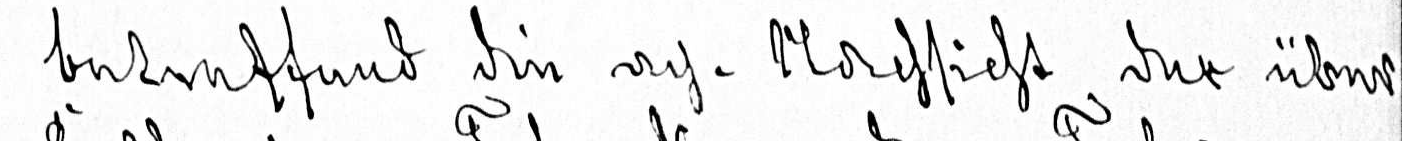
betreffend die ag. Nachsicht der über
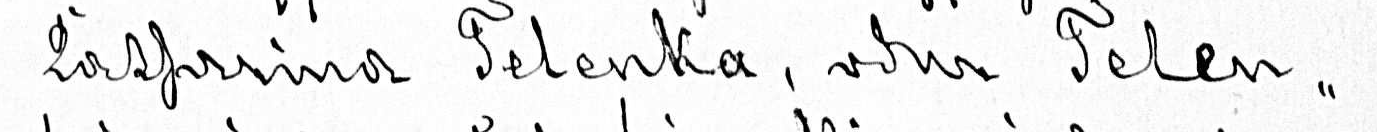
Katharina Telenka, oder Telen¬
